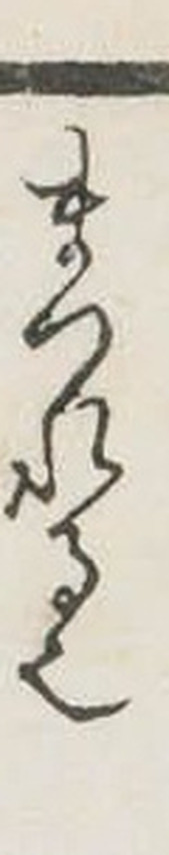まつれる也
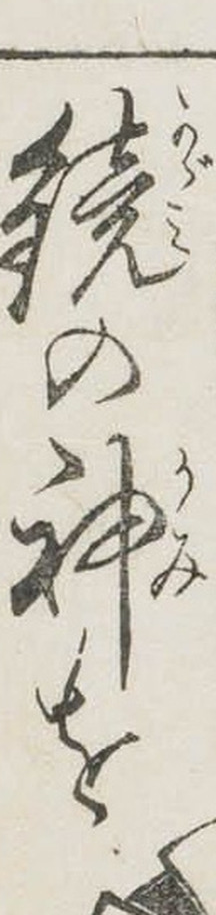鏡の神を
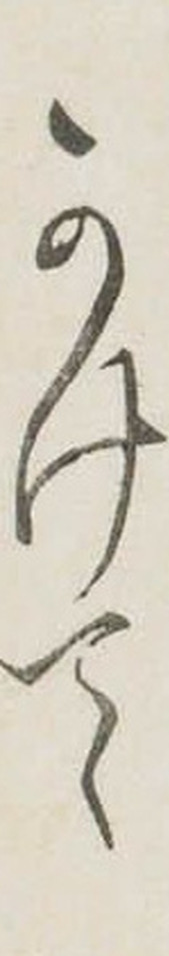かけて
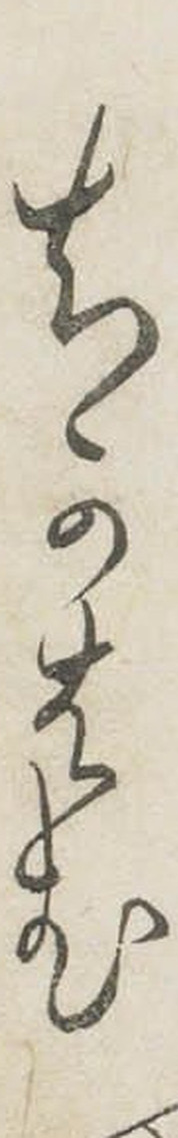ちかはむ

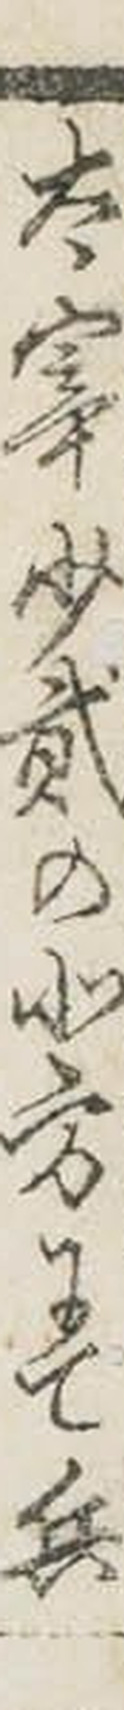太宰少弐の北方にて兵
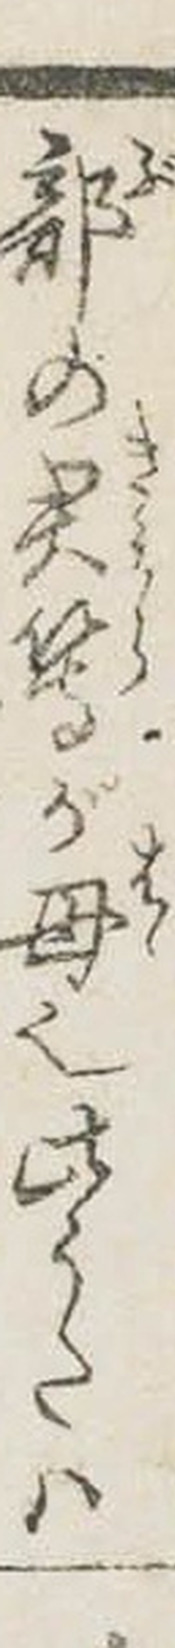部の君等が母也此うたは
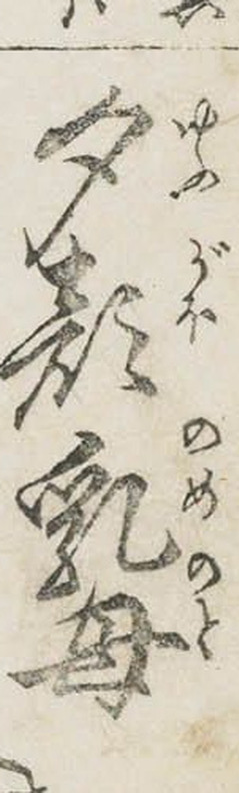夕顔乳母
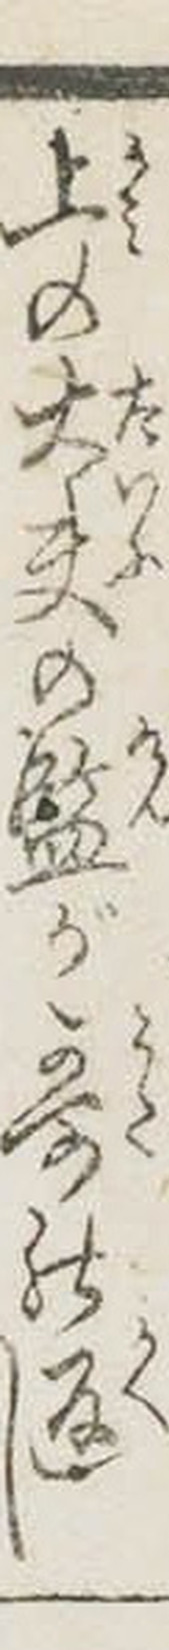上の大夫の監が哥の返し
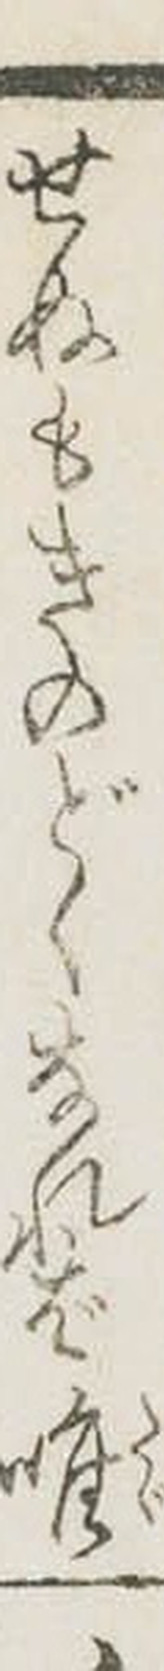せぬもきのどくなれば唯
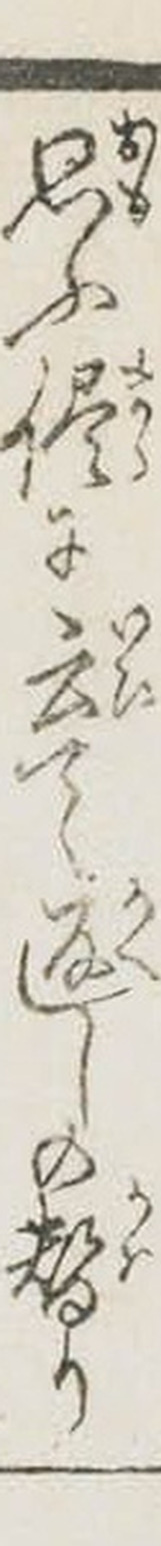思ふ儘に云て返しの替り
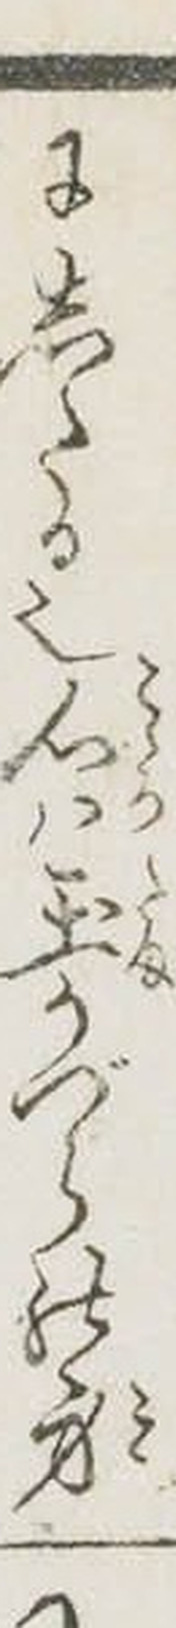にしたる也心は玉かづらの身
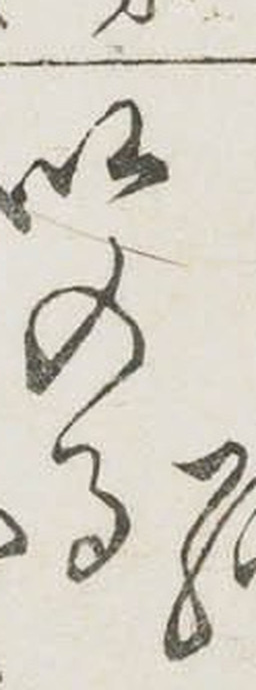いのる
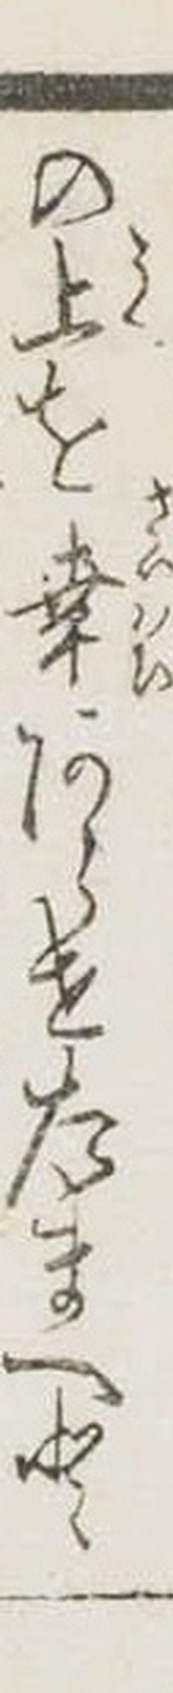の上を幸あらせたまへと
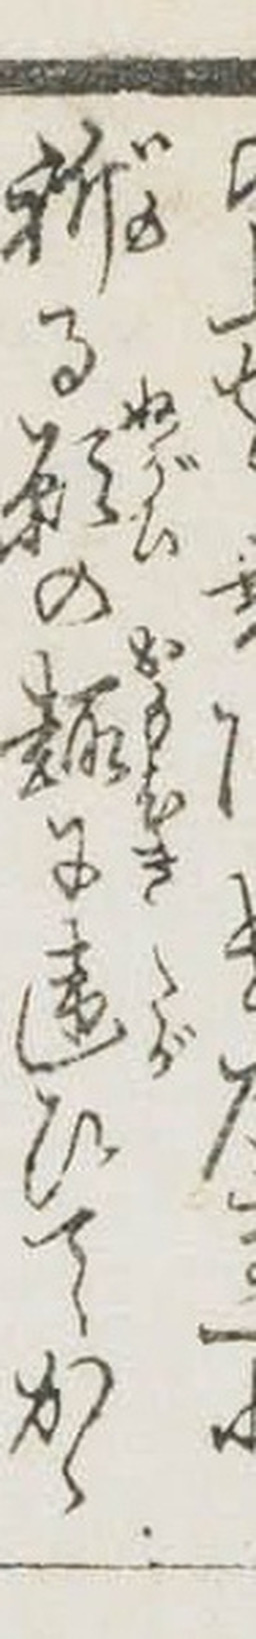祈る願の趣に違ひてかゝ
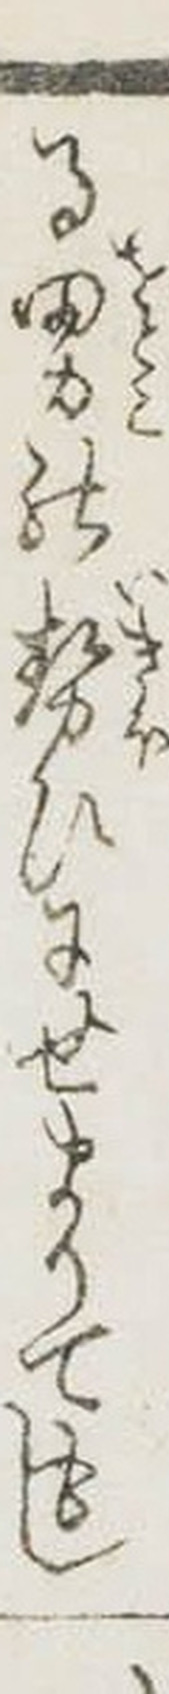る男の勢ひにせまりてもし
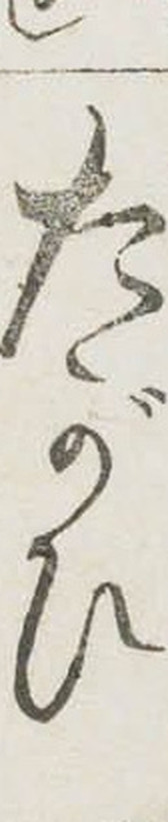たがひ
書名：源氏百人一首
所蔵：東京学芸大学教育コンテンツアーカイブ
